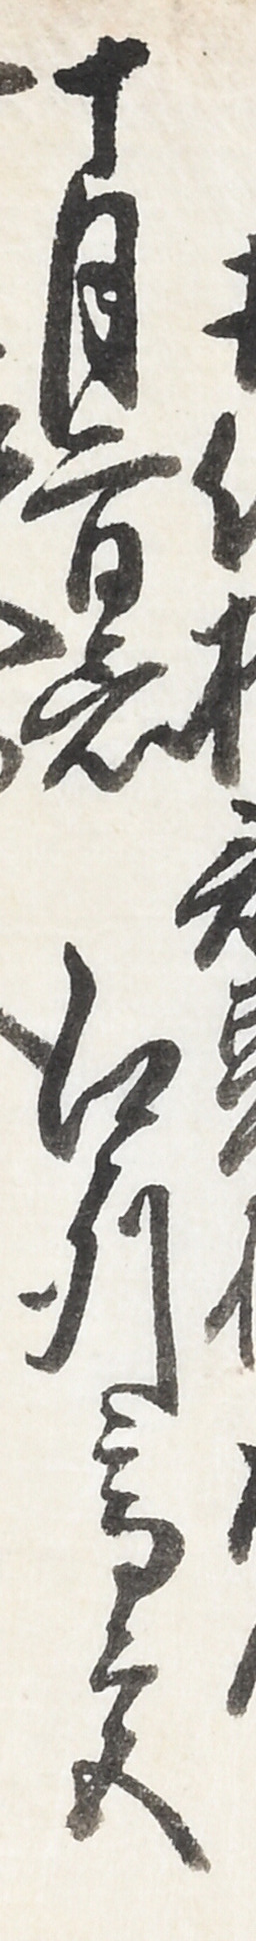十月二日着江州高宮
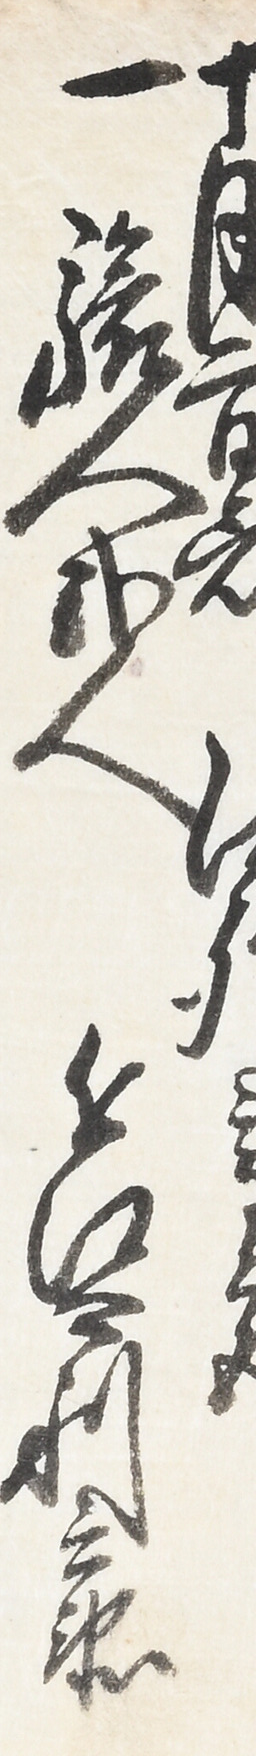一旅人弐人近江や利兵衛
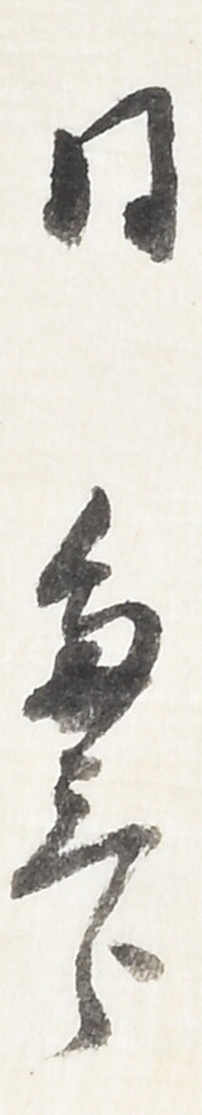同多三郎
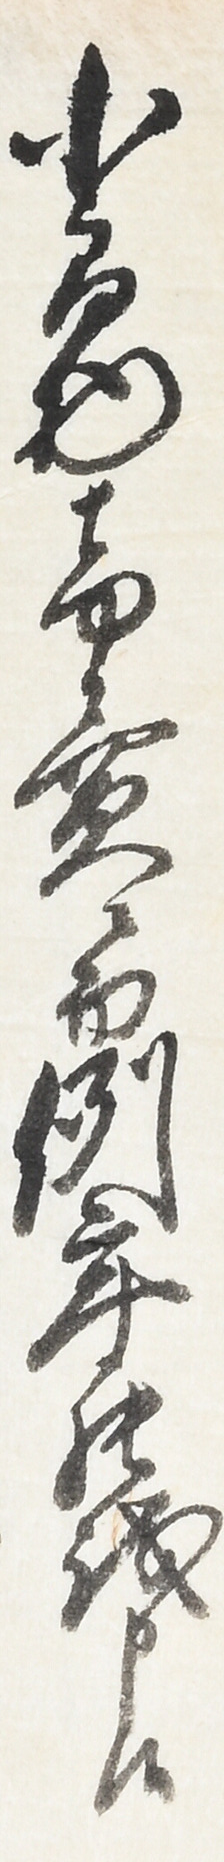小間物商売ニ而例年罷越申候
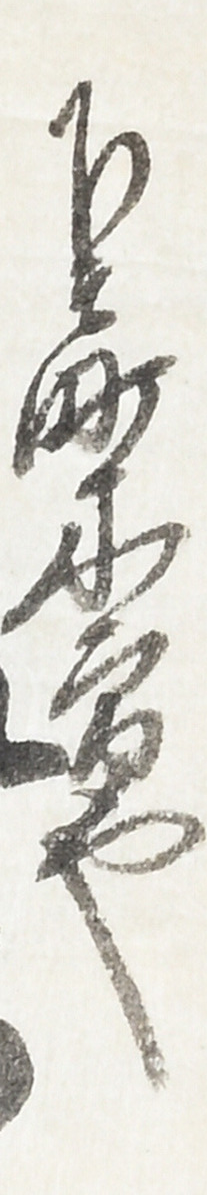下モ町木曽や
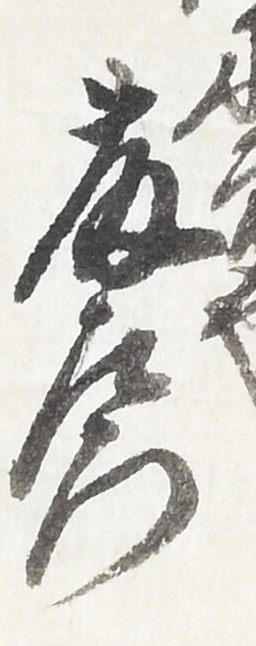籐左衛門
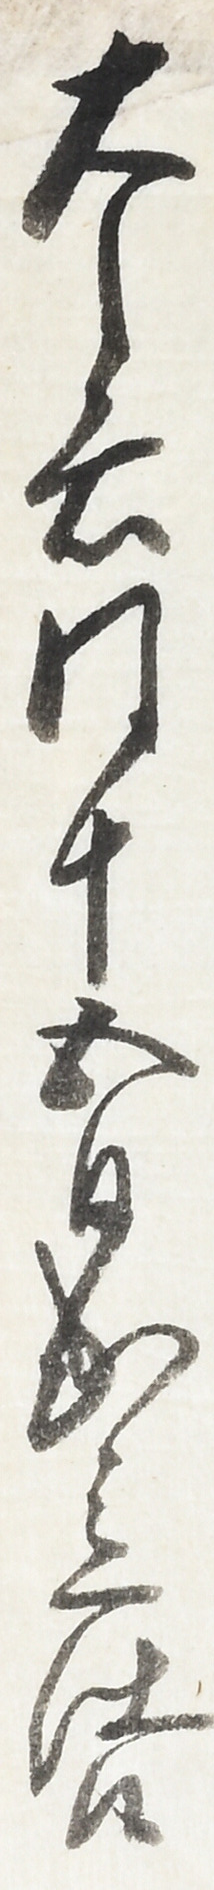右之者同十五日出立仕候

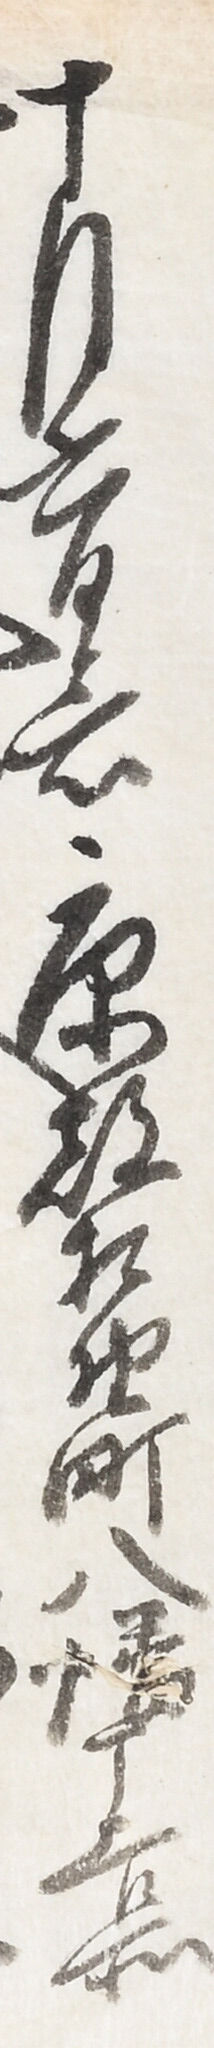十月六日着京都相野町八幡丁上ル所
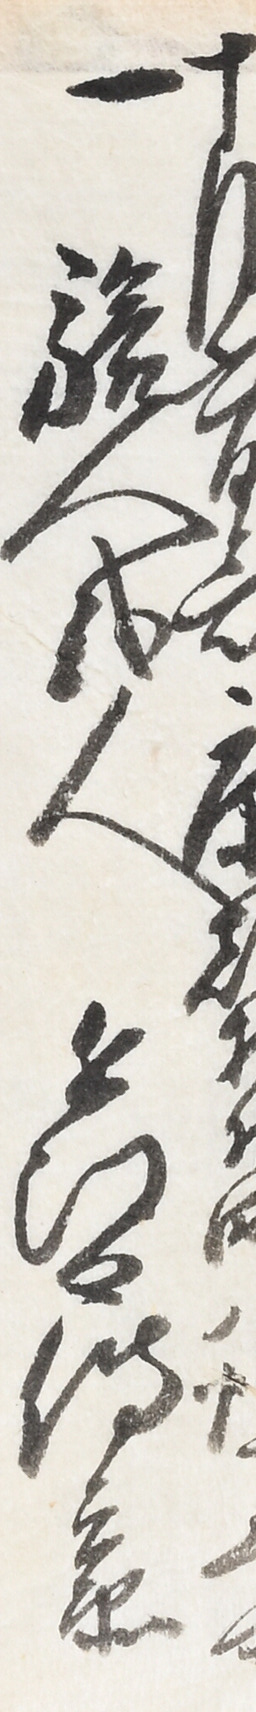一旅人弐人近江や伝兵衛
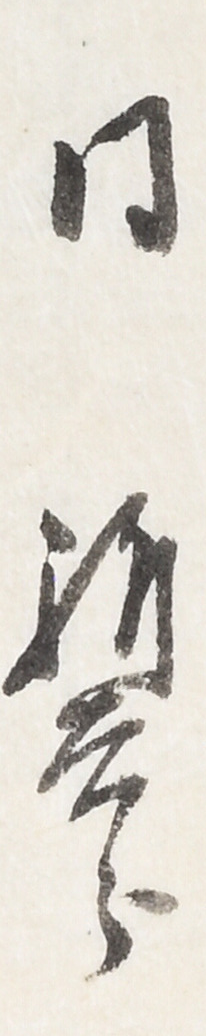同新太郎
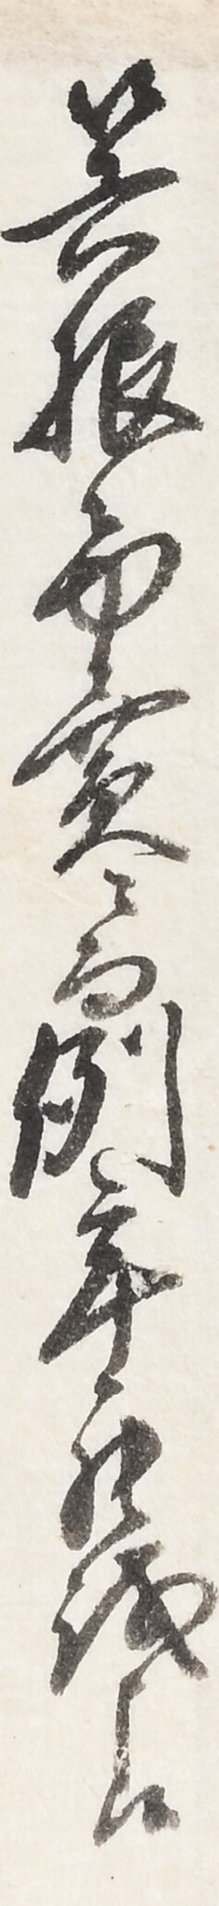呉服商売ニ而例年罷越申候
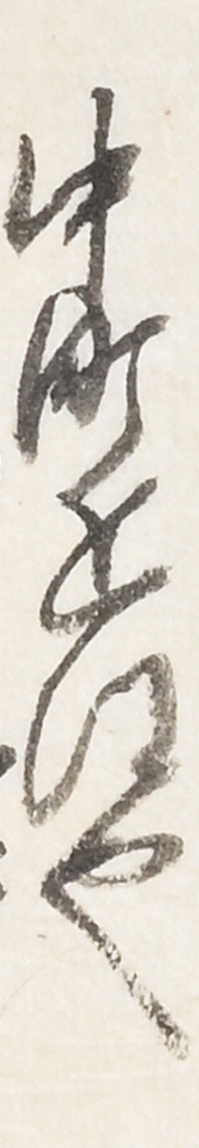中町近江や
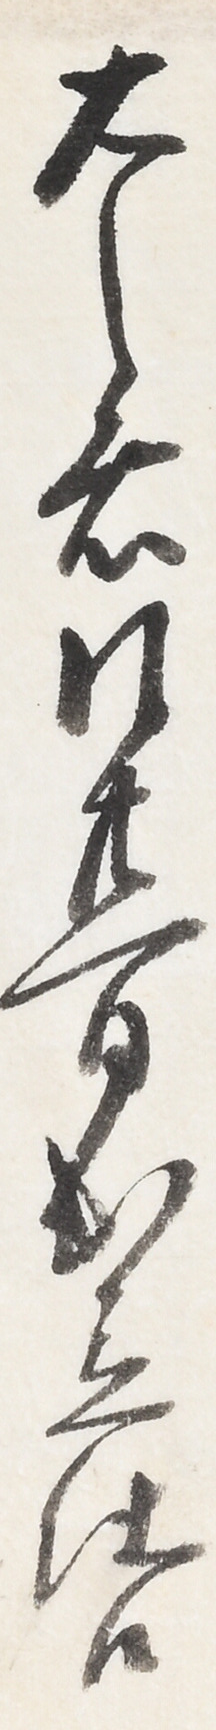右之者同廿一日出立仕候
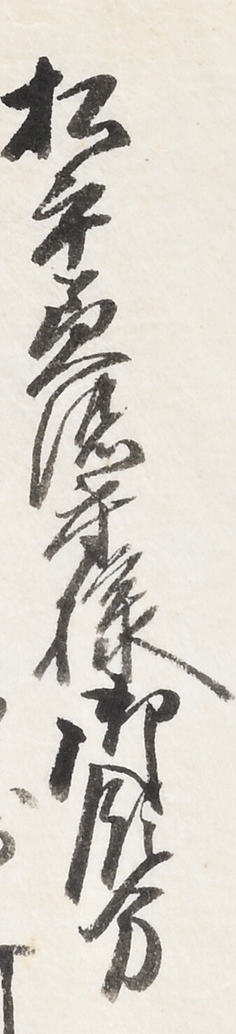松平美濃守様御領分
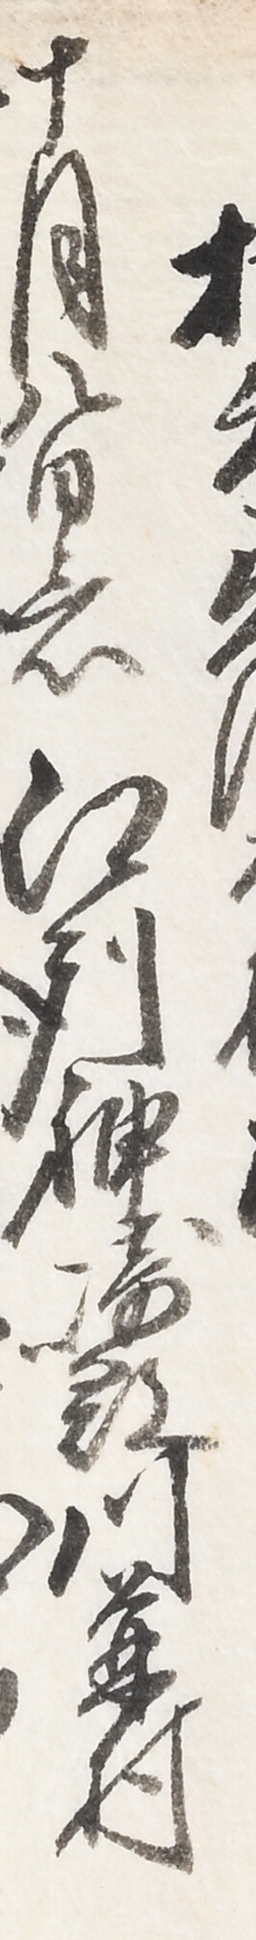十月八日着江州神崎郡川並村
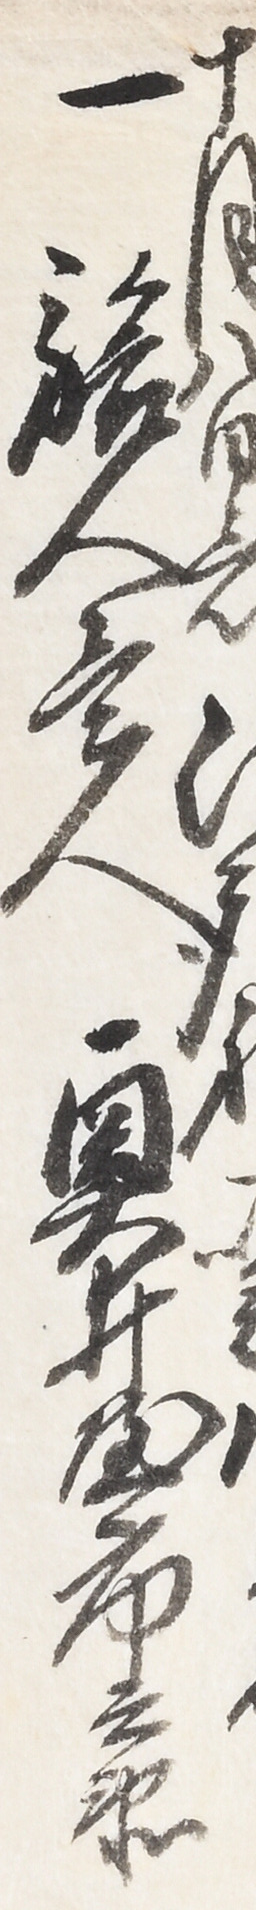一旅人壱人奥井屋市兵衛
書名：旅人泊控帳
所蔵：伊那市立高遠町図書館・合同会社AMANE
